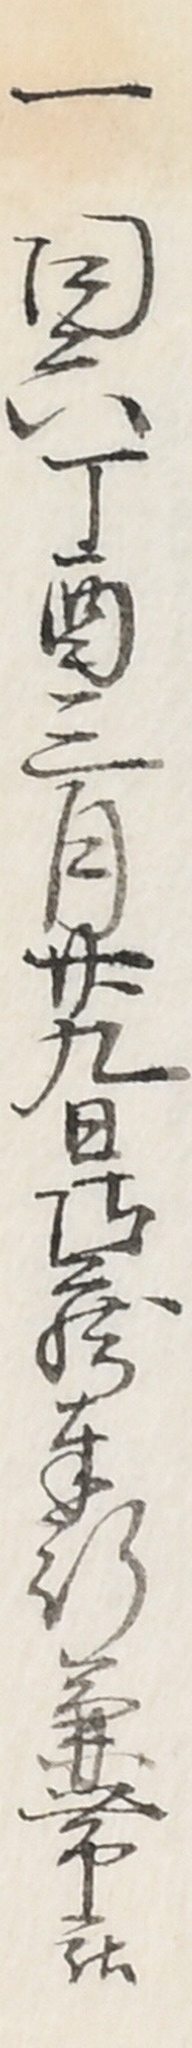一同六丁酉三月廿九日御蔵奉行兼帯被
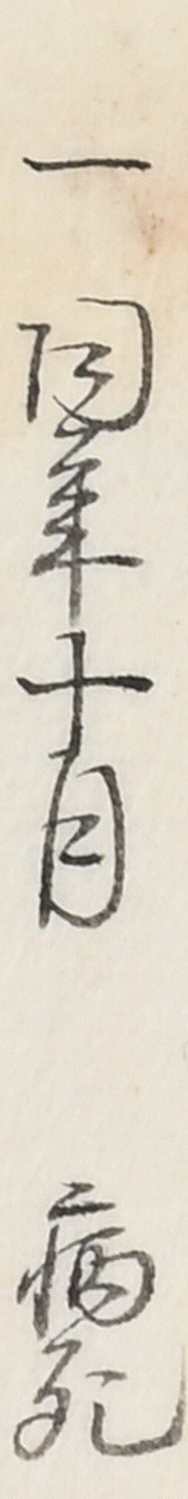一同年十月病死
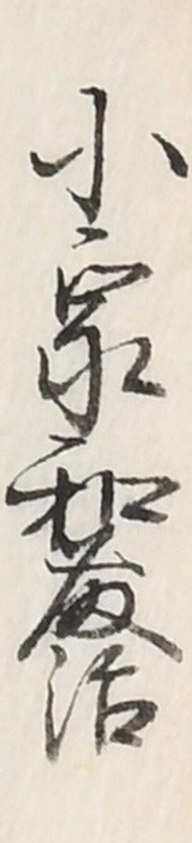小泉和藤治
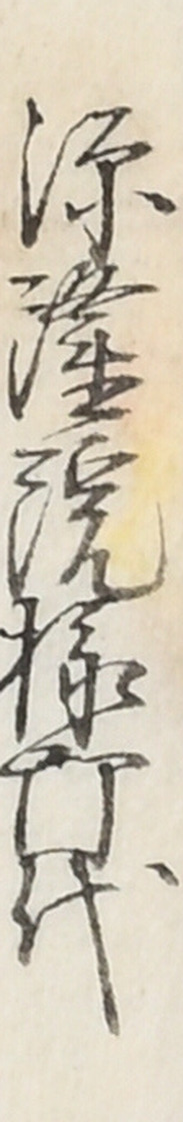源隆院様御代
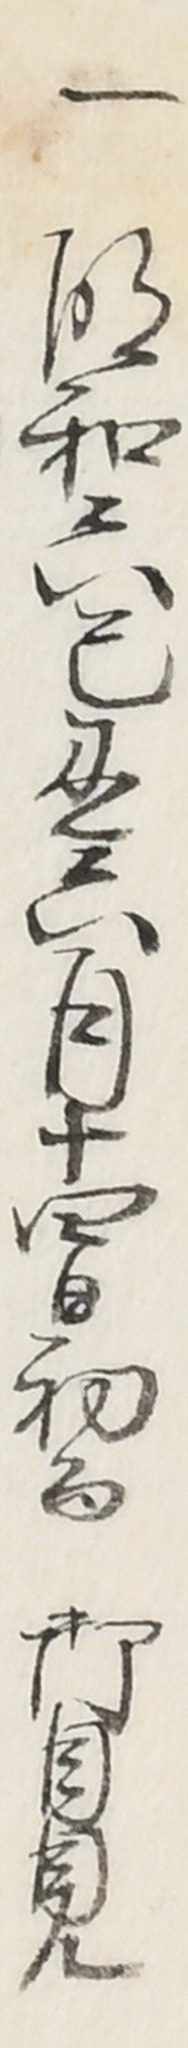一明和六己丑六月十四日初而御目見
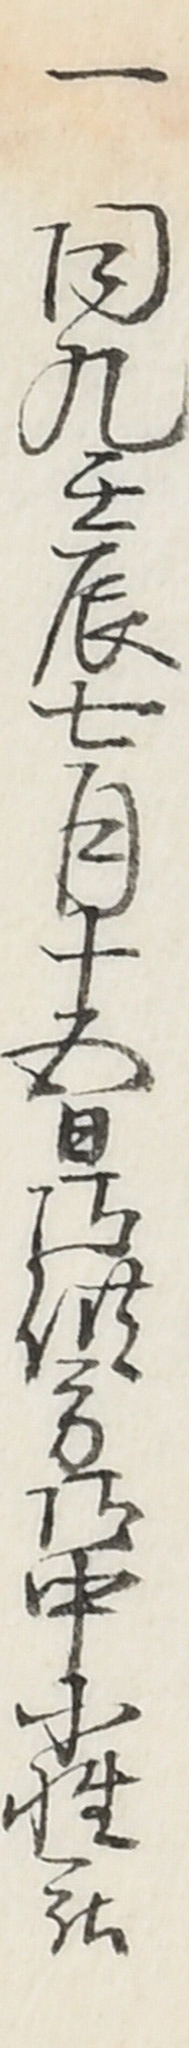一同九壬辰七月十五日御供方御中小性被
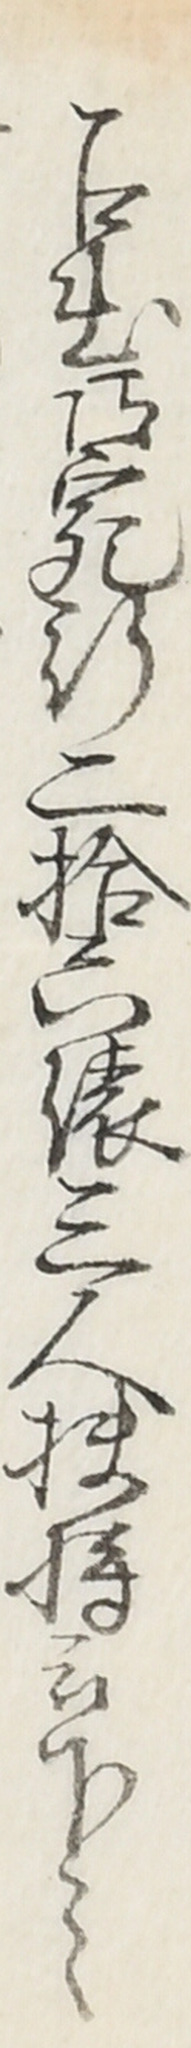召出御宛行二拾六俵三人扶持被下之
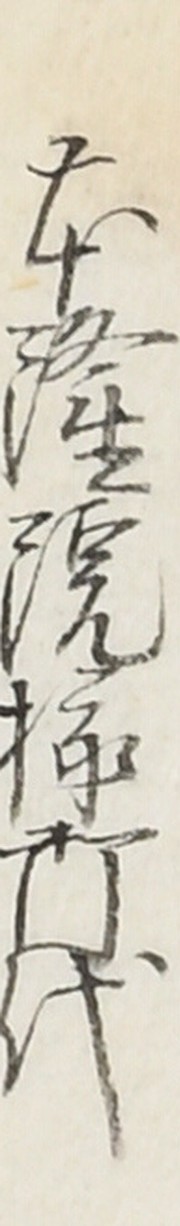本隆院様御代
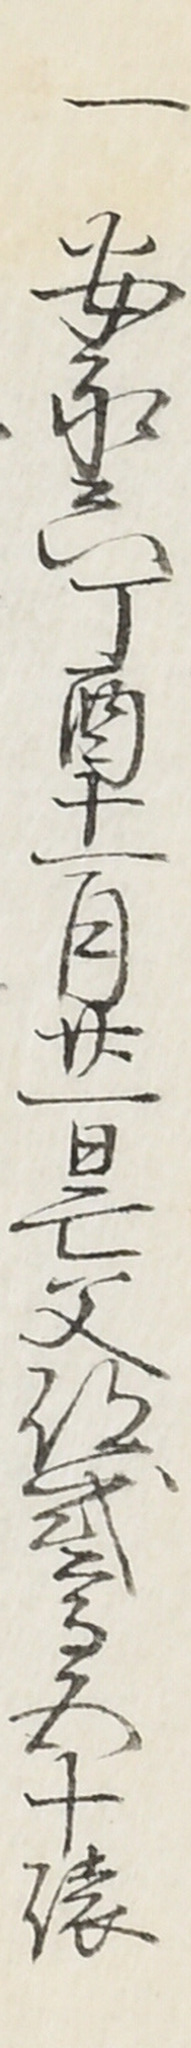一安永六丁酉十一月廿一日亡父跡式高五十俵
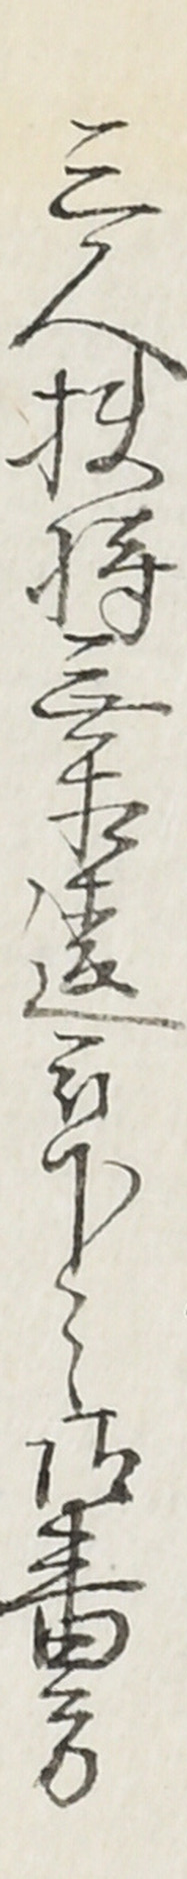三人扶持無相違被下之御番方
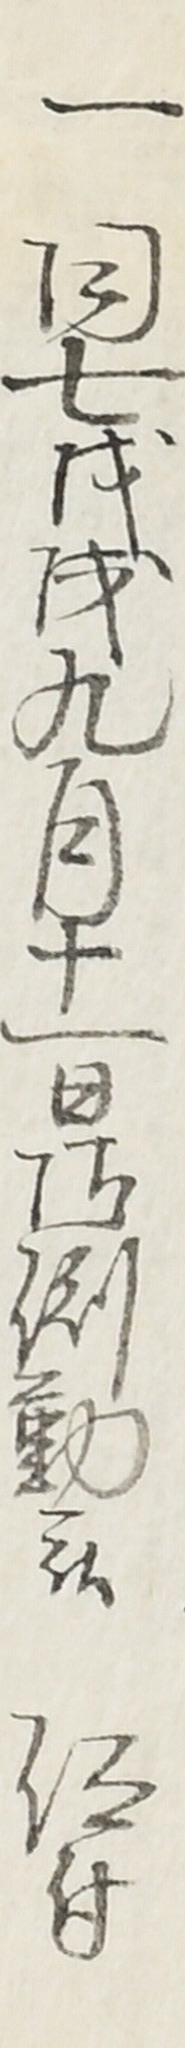一同七戊戌九月十一月御側勤被仰付
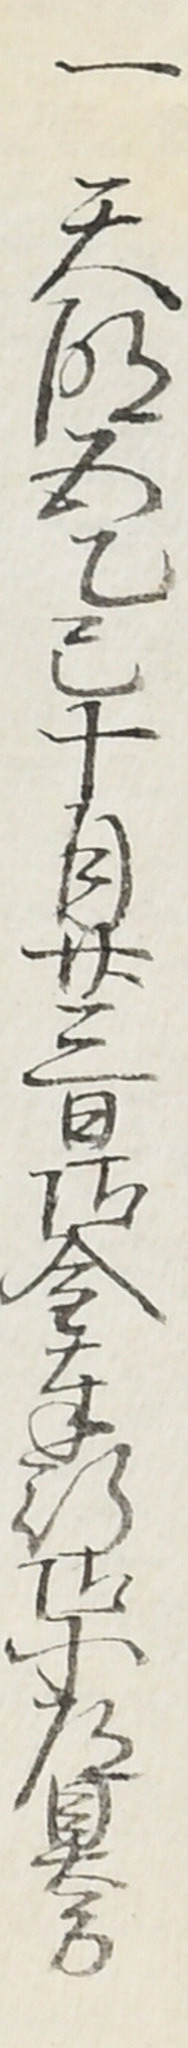一天明五乙巳十月廿三日御金奉行御小道具方
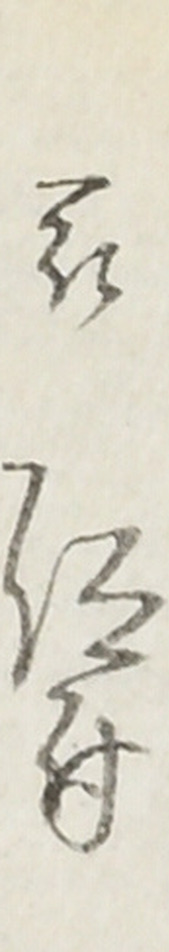被仰付
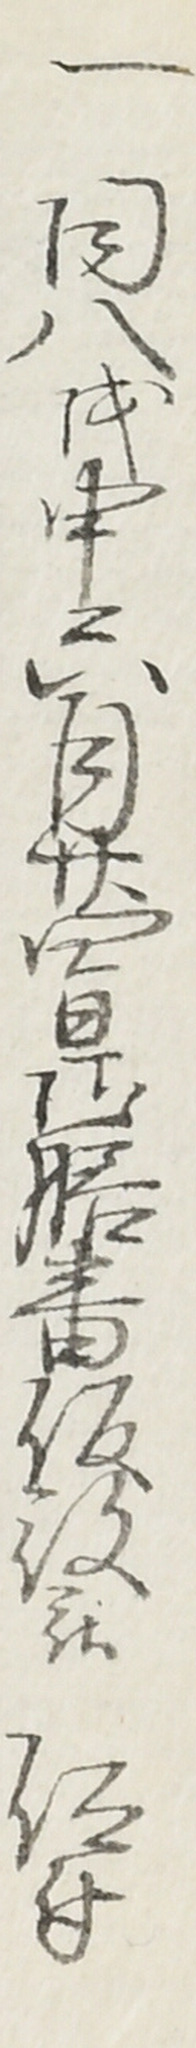一同八戊申六月廿四日御膳番仮役被仰付
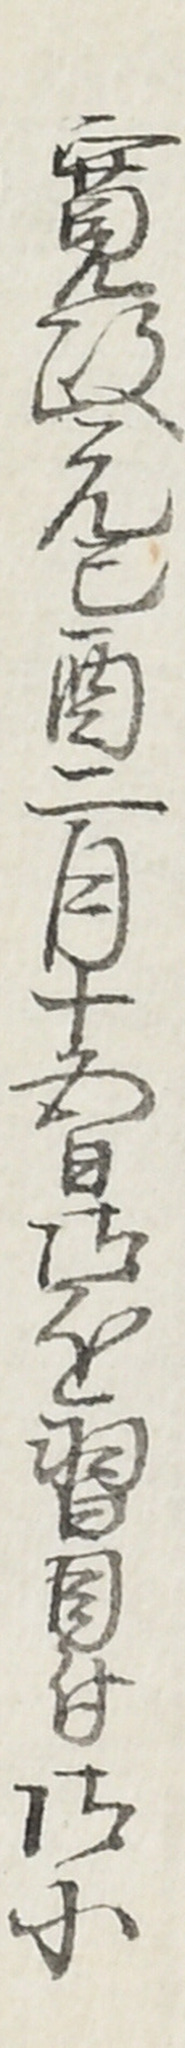一寛政元己酉二月十五日御近習目付御小
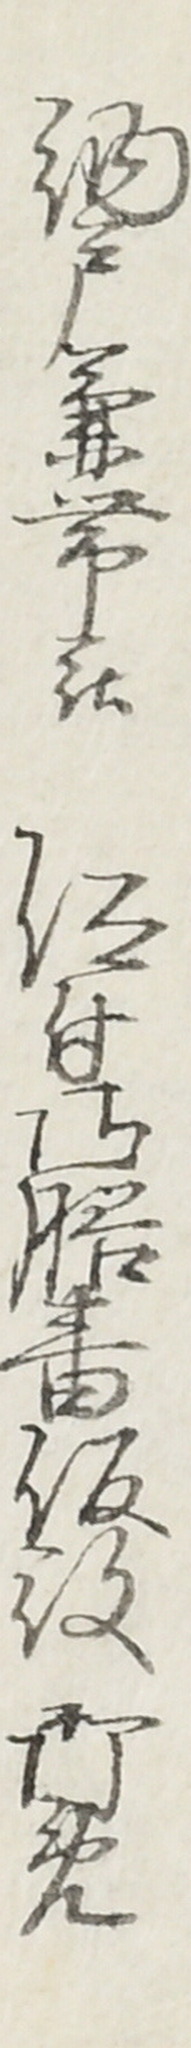納戸兼帯被仰付御膳番仮役御免
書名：給人諸士勤仕録（七）
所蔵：伊那市立高遠町図書館・合同会社AMANE
